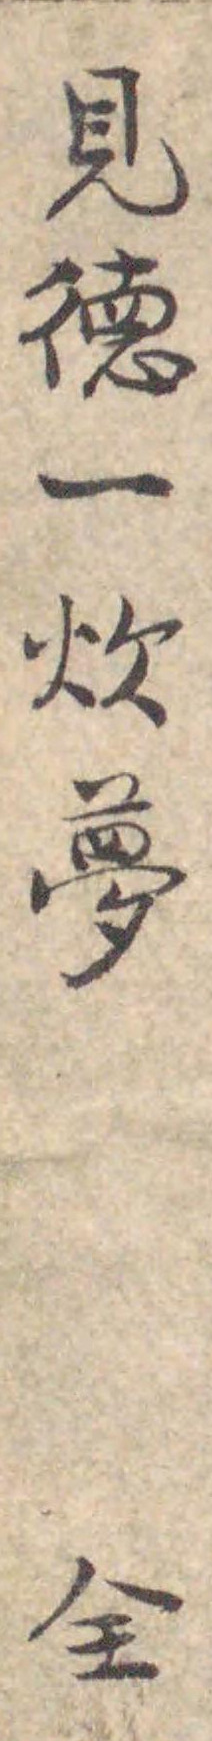見徳一炊夢全

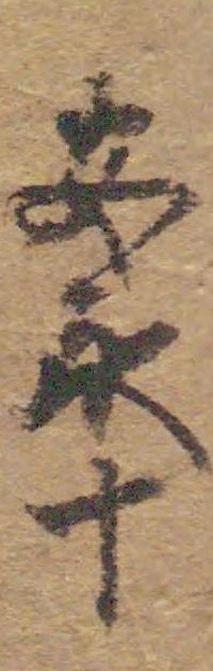安永十
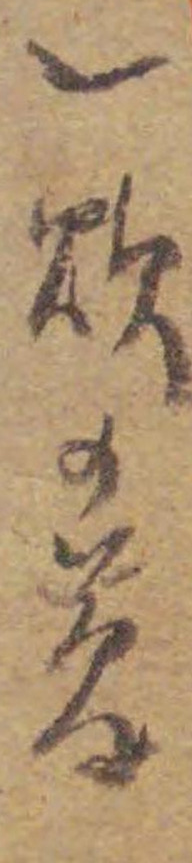一炊の夢

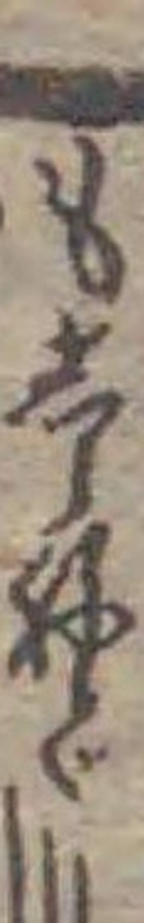もしらねど
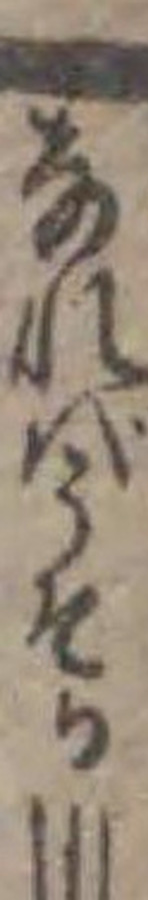なればうそか
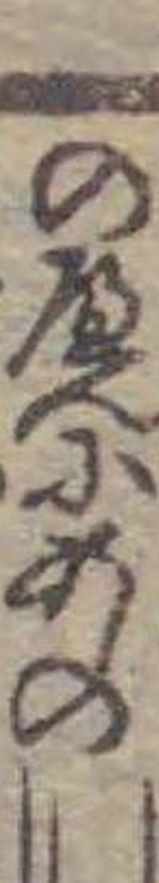のへんにあしの
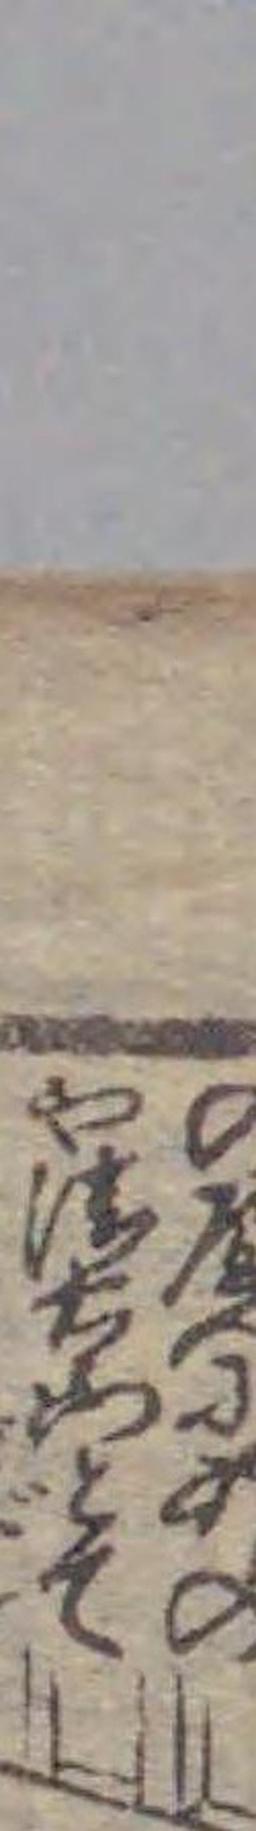や清右衛門とて
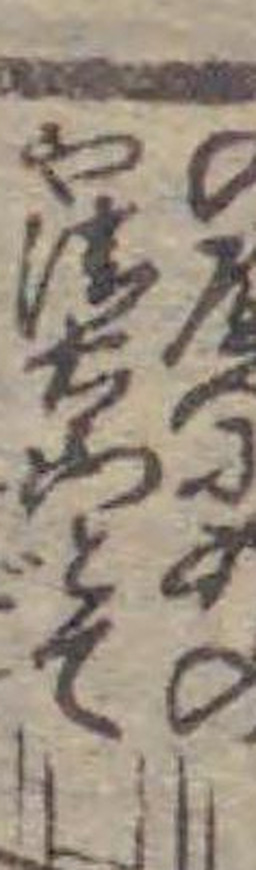や清右衛門とて
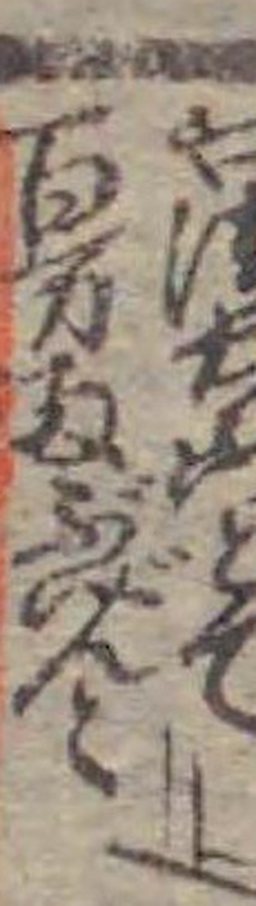百万両ぶげんと
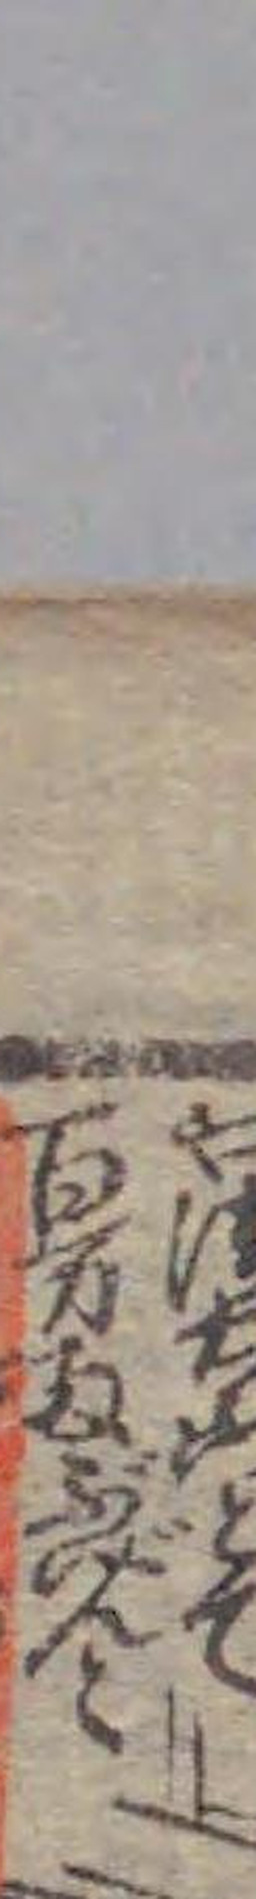百万両ぶげんと
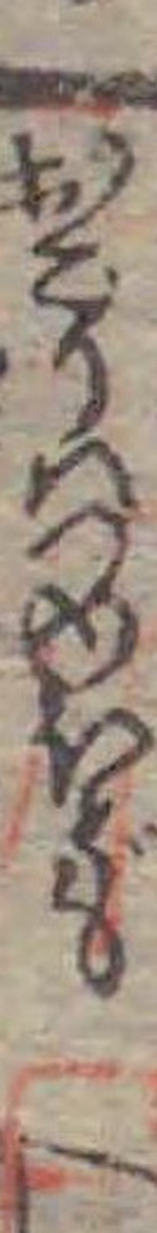おごりはつゆほども
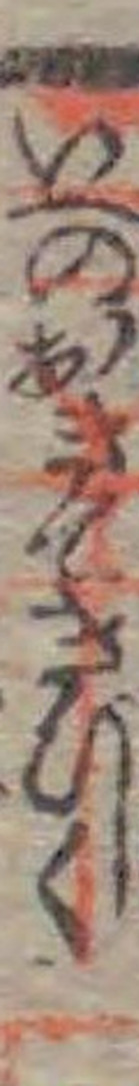いへのおきてきびしく
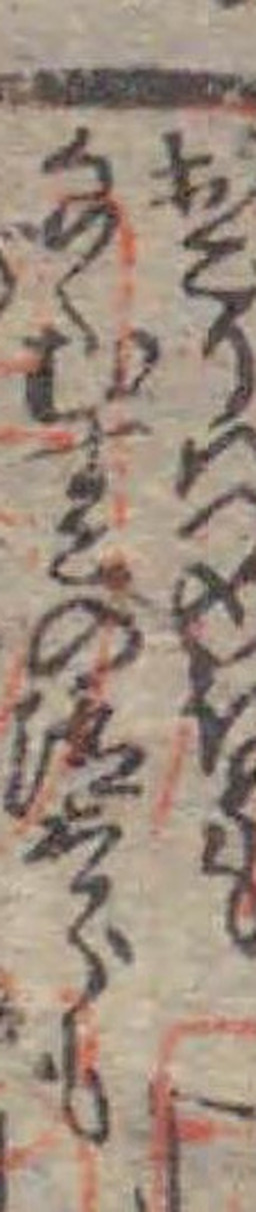なくむすこの清太郎も
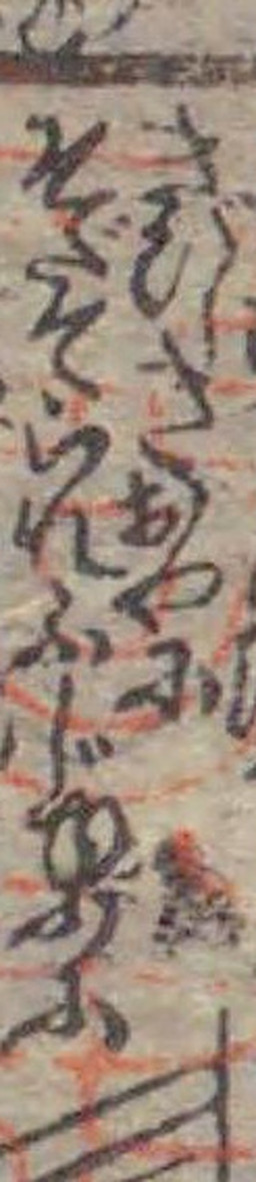そだてられふじゆふに
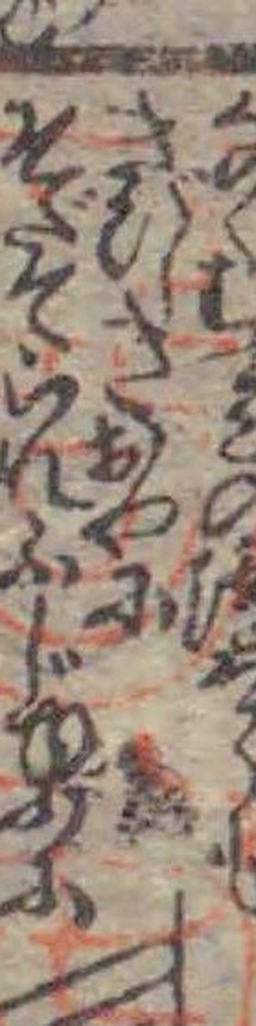そだてられふじゆふに
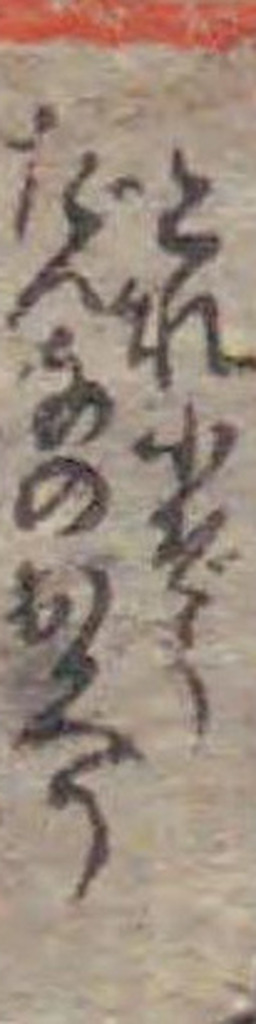だんなのおかへり
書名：見徳一炊夢 : 3巻
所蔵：国立国会図書館 National Diet Library, JAPAN
